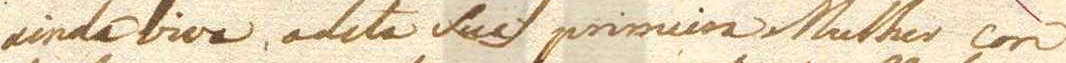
ainda viva, a dita Sua primeira Mulher con
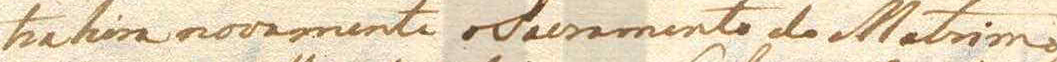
trahira novamente o Sacramento do Matrimo
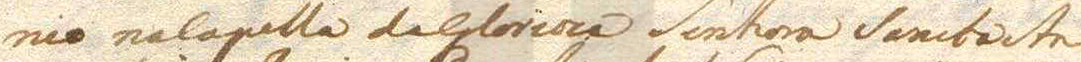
nio na Capella da Glorioza Senhora Sancta An
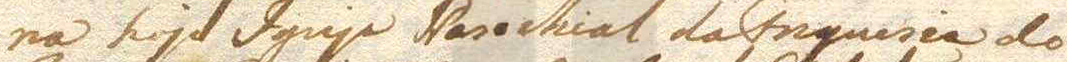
na hoje Igreja Parochial da Freguesia do
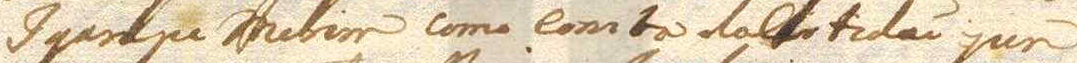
Igarape Mearim como consta da Certidão jun
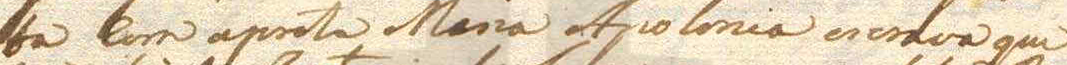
to com a preta Maria Apolonia escrava que
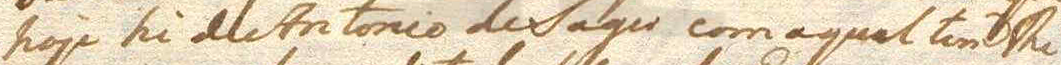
hoje hé de Antonio de Sager com a qual tem thé
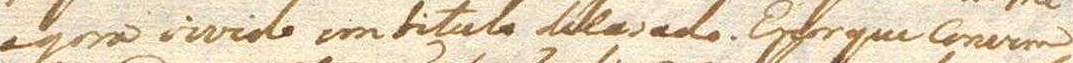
agora vivido em titulo de casado. E porque convem
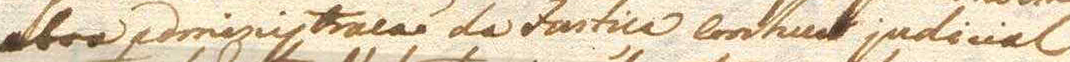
a boa administraçaõ da Iustiça contheuda judicial
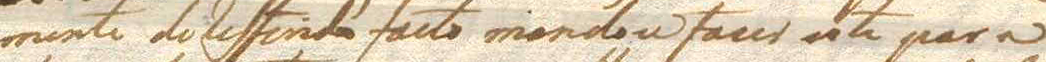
mente do Refferido facto mandou fazer esta para
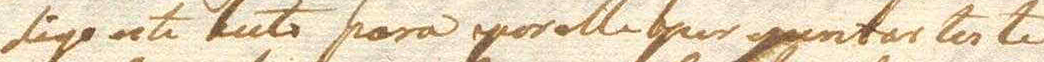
digo este auto para por elle perguntar teste
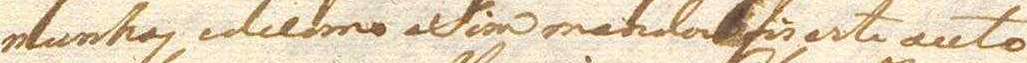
munhas e de como asim mandou fis este auto
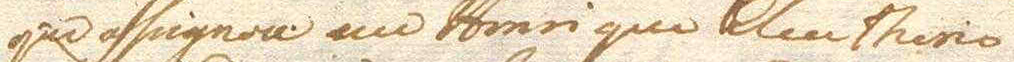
que assignou eu Henrique Eleutherio
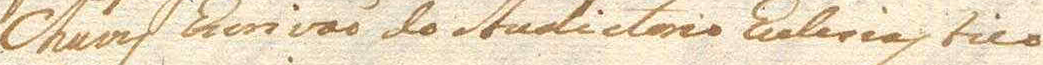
Chaves Escrivaõ do Audictorio Ecclesiastico
